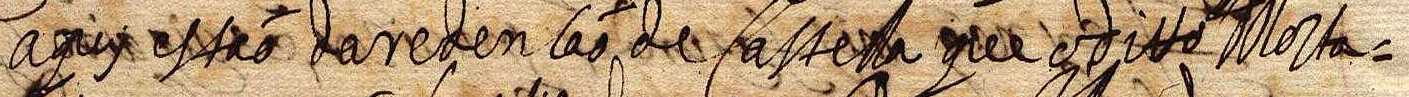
aquy estaõ da redençaõ de Castella que o ditto Mozta
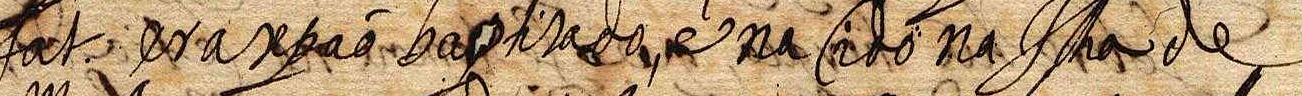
fat era xpaõ baptizado, e naCido na Jlha de
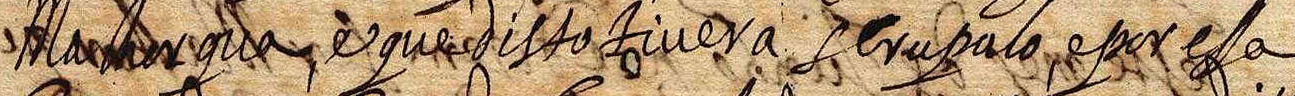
Malhorqua, e que disto tiuera scrupulo, e por essa
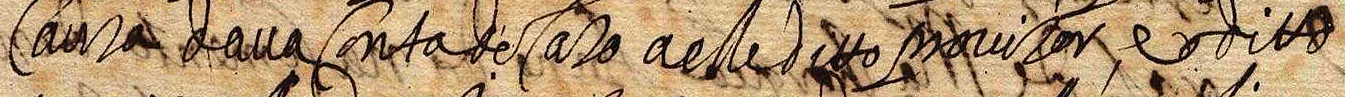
Cauza daua Conta do Cazo a elle ditto prouizor, e o ditto
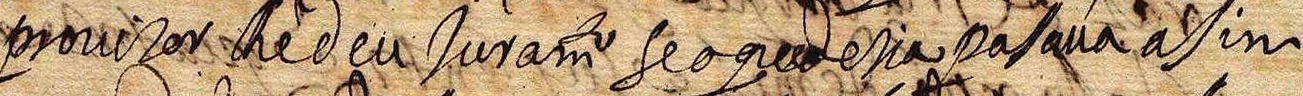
prouizor lhe deu Juramto se o que dezia passaua asim
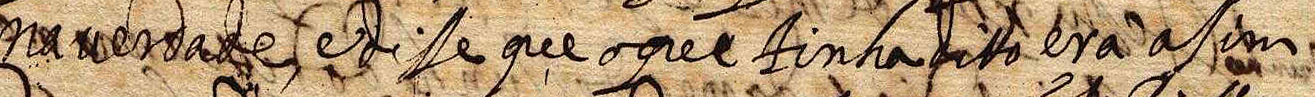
na uerdade, e disse que o que tinha ditto era asim
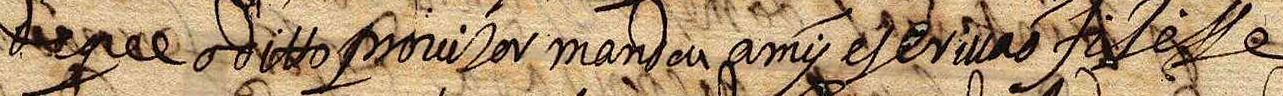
do que o ditto prouizor mandou a mȳ escriuaõ fizesse
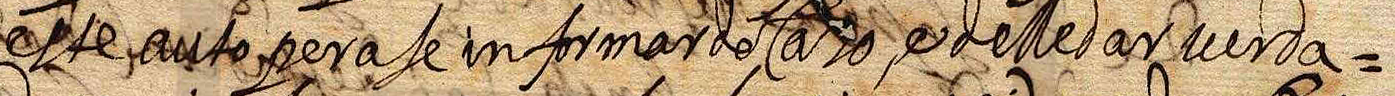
este auto pera se informar do Cazo, e delle dar uerda
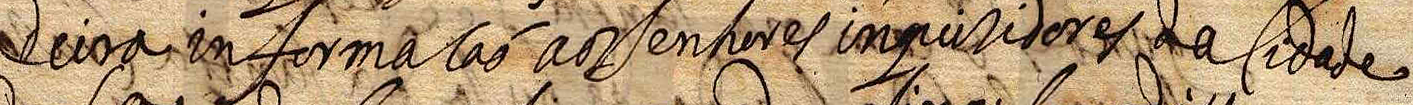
deira informaçaõ aos Senhores inquizidores da Cidade
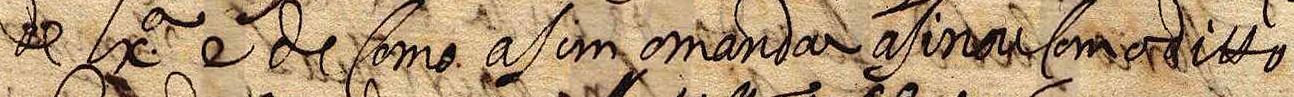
de lx.a e de Como asim o mandou asinou Com o ditto
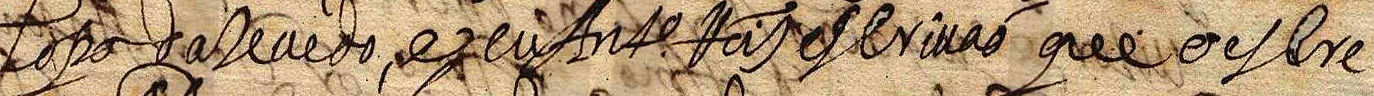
Lopo dazevedo, e eu Ant.o Roīs escriuaõ que o escre
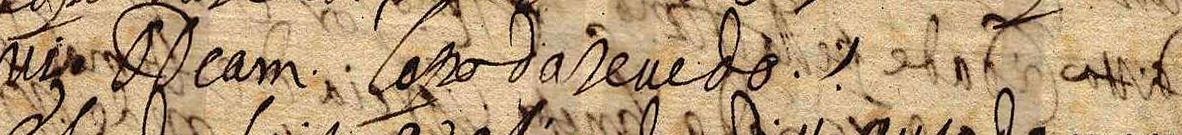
ui. O Deam Lopo dazevedo.
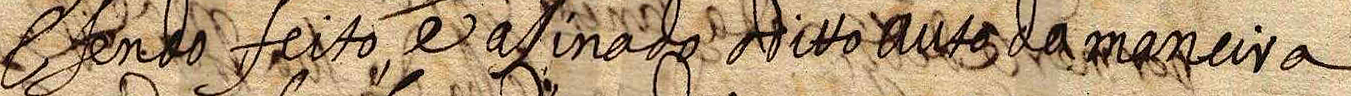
E sendo feito, e asinado o ditto auto da maneira
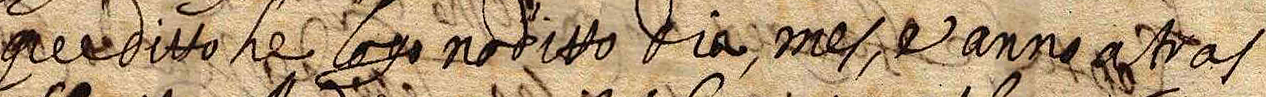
que ditto he logo no ditto dia, mes, e anno atras
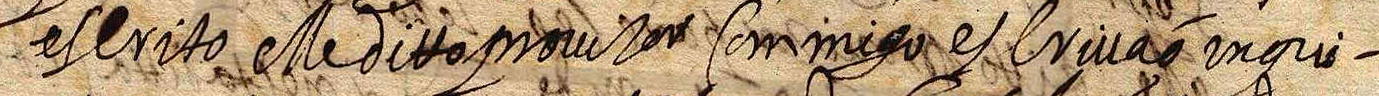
escrito elle ditto prouizor Commigo escriuaõ inqui
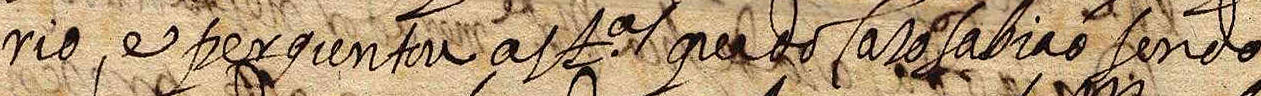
rio, e perguntou as t.as que do Cazo sabiaõ sendo
